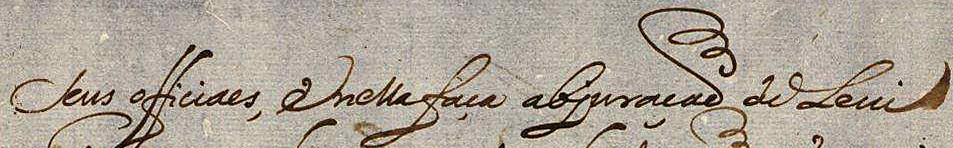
Seus officiaes, e nella faça abjuraçaõ de Leui
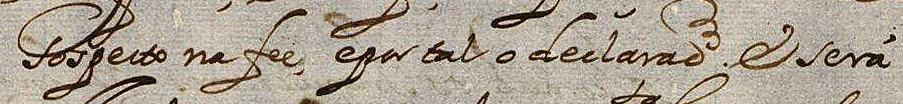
sospeito na fee, e por tal o declaraõ. E será
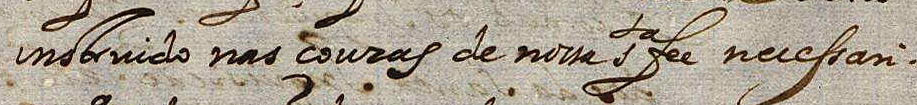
instruido nas couzas de nossa sta fee necessari
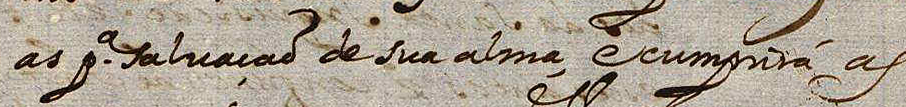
as p.a saluaçaõ de sua alma, e cumprirá as
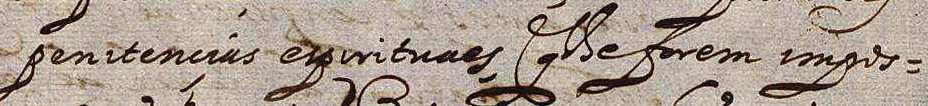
penitencias espirituaes, q̄ lhe forem impos
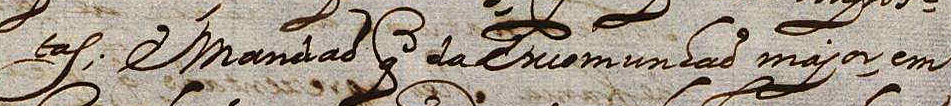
tas; E mandaõ q̄ da excomunhaõ major, em
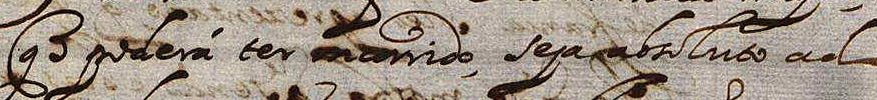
q̄ poderá ter encorrido, seja absoluto ad
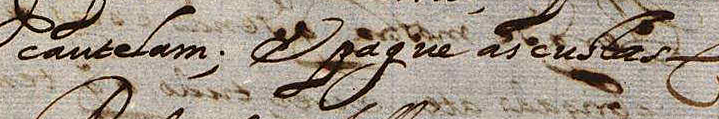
cautelam; E pague as custas
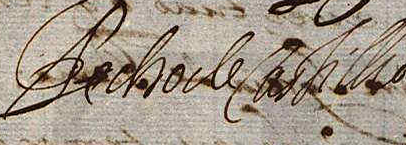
Pedro de Castilho
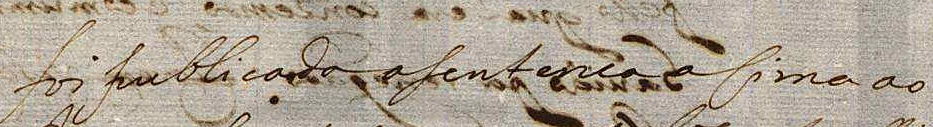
foi publicada a sentença aCima ao
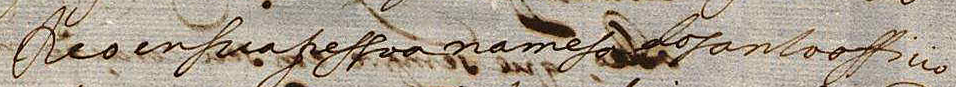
Reo en sua pessoa na mesa do santo officio
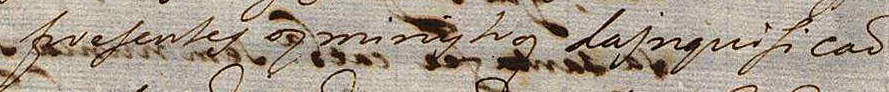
presentes os ministros da jnquisiçaõ
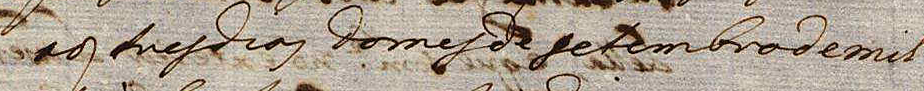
aos tres dias do mes de setembro de mil
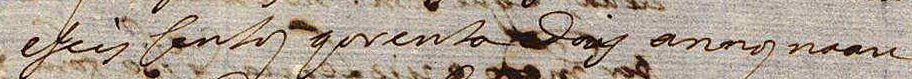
e seisCentos qorenta e dous annos na au
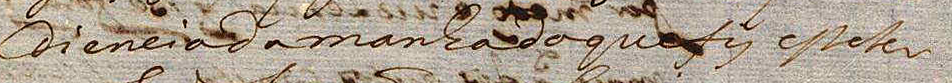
diencia da manha do que fis este ter
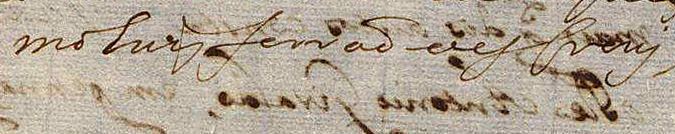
mo luis ferraõ o esCreuj
